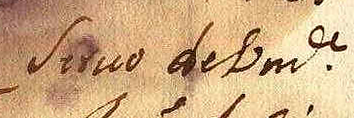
Seruo de Vm.ce
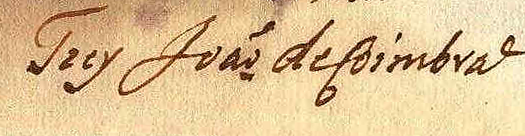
Frey Joaõ de Coimbra
